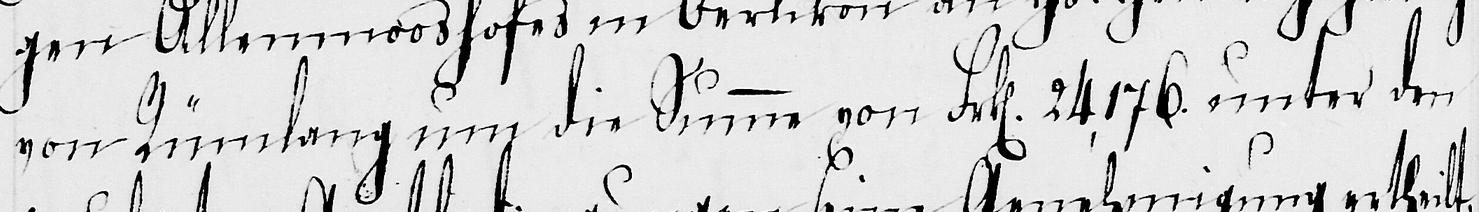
von Rümlang um die Summe von Frk[en]. 24,176. un¬
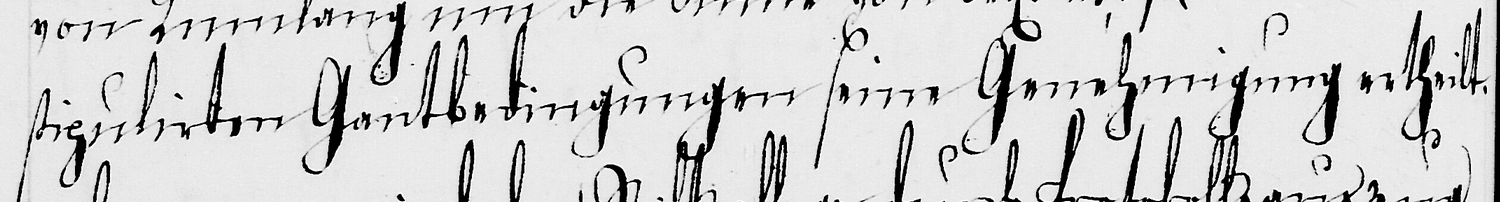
stipulirten Gantbedingungen seine Genehmigung erhteil¬
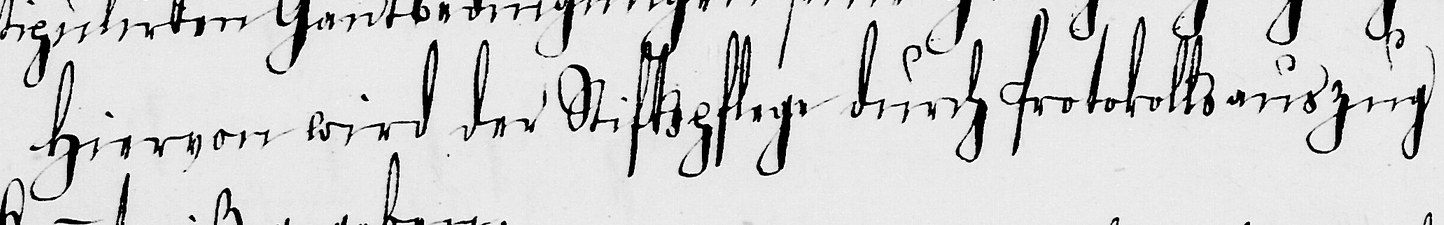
Hiervon wird der Stiftspflege durch Protokollsau¬
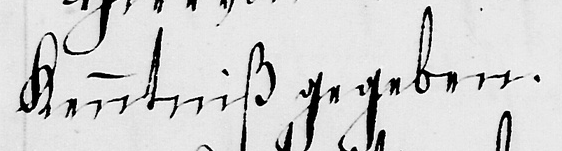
Kenntniß gegeben.
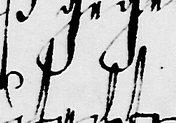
gelegt.
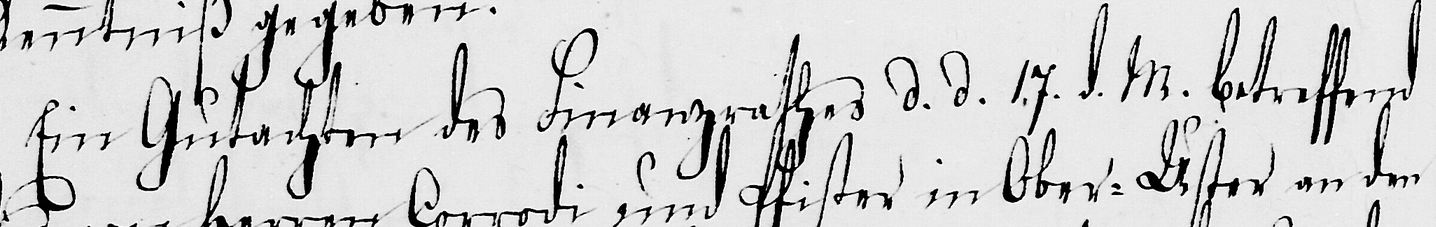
Ein Gutachten des Finanzrathes d. d. 17. d. M. betreffend
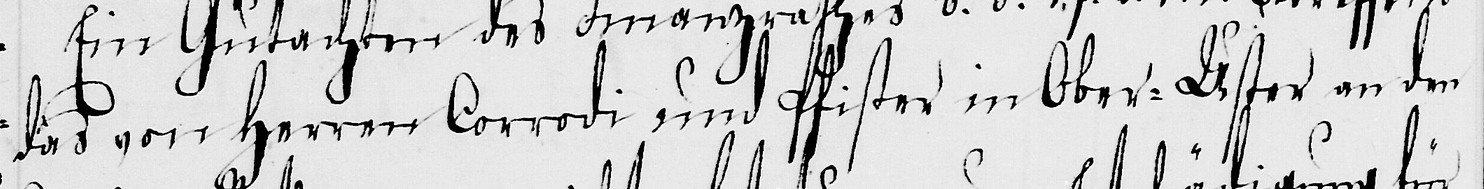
das von Herren Corrodi und Pfister in Ober-Uster an den
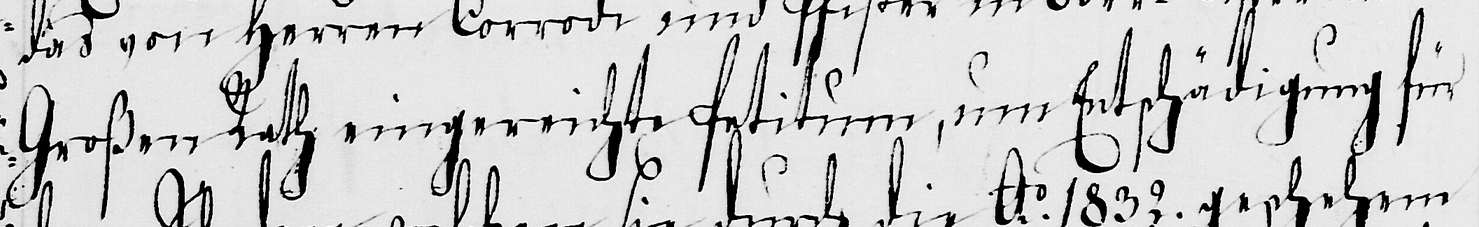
Großen Rath eingereichte Petitum, um Entschädigung für
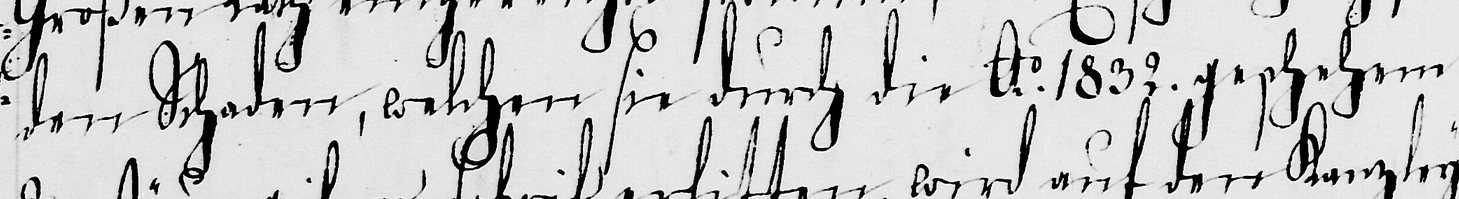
den Schaden, welchen sie durch die Ao. 1832. geschehene
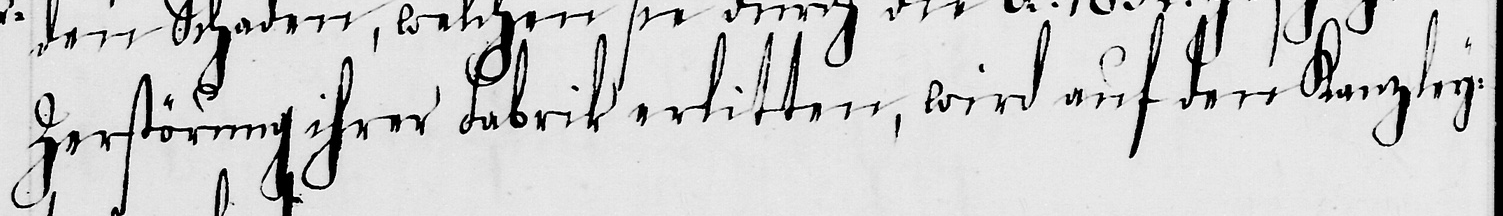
Zerstörung ihrer Fabrik erlitten, wird auf den Kanzley¬
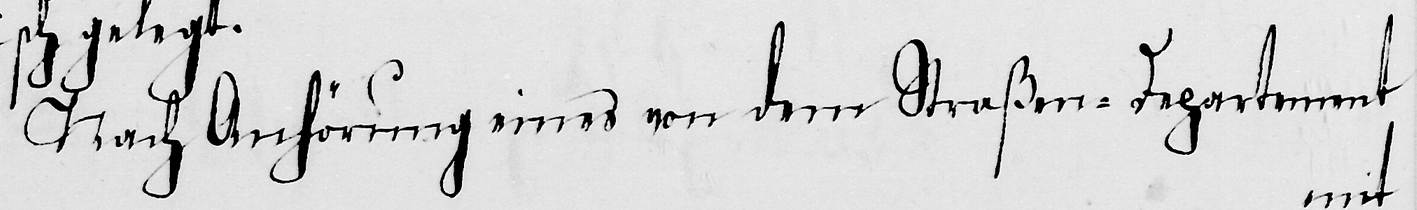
Nach Anhörung eines von dem Straßen-Departement
